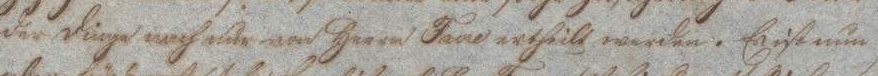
der Dinge nach nur von Herrn Favre ertheilt werden. Es ist nun
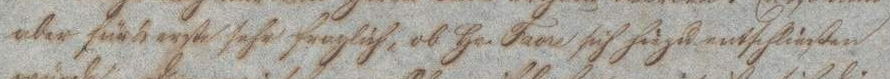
aber für's erste sehr fraglich, ob Hr. Favre sich hiezu entschließen
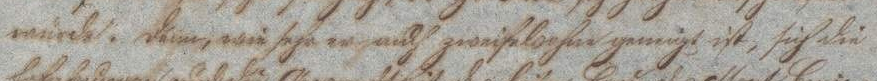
würde. Denn, wie sehr er auch zweifelsohne geneigt ist, sich die
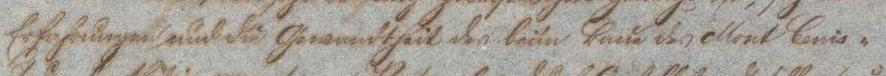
Erfahrungen und die Gewandtheit des beim Baue des Mont Cenis-
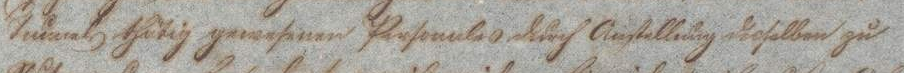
Tunnels thätig gewesenen Personales durch Anstellung desselben zu
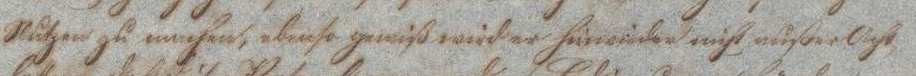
Nutzen zu machen, ebenso gewiß wird er hinwieder nicht außer Acht
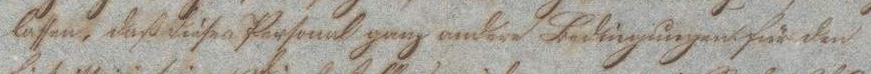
lassen, daß dieses Personal ganz andere Bedingungen für den
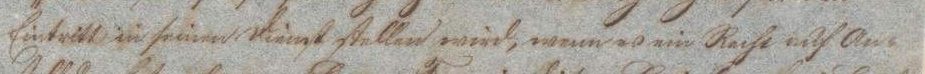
Eintritt in seinen Dienst stellen wird, wenn es ein Recht auf An-
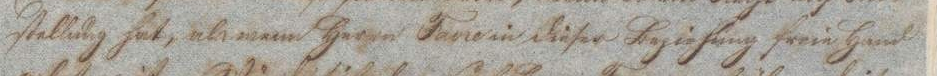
stellung hat, als wenn Herrn Favre in dieser Beziehung freie Hand
